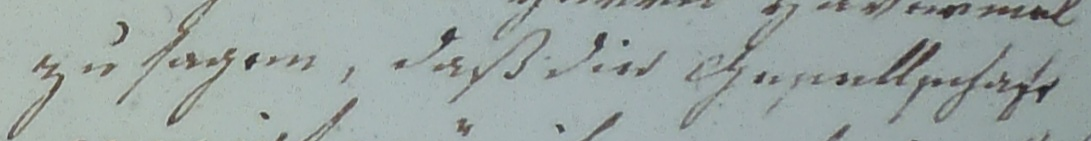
zu sagen, dass die Gesellschaft
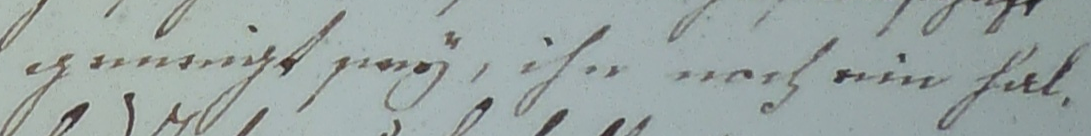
geneigt sey, ihn noch ein hal¬
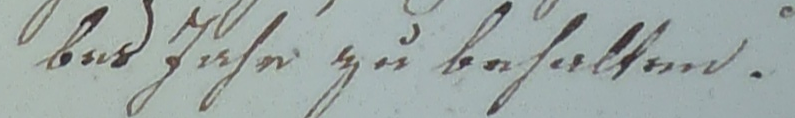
bes Jahr zu behalten.
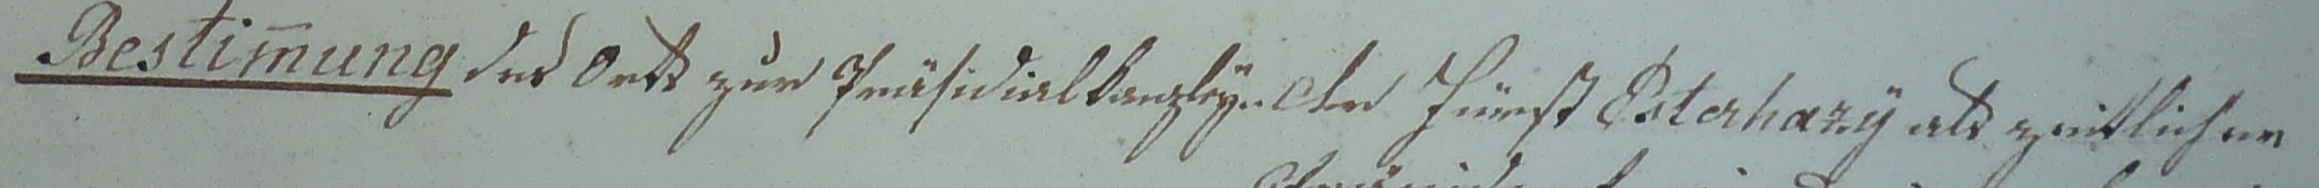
Bestim̅ung des Orts zur Präsidialkanzley.. Der Fürst Esterhazy als zeitlicher
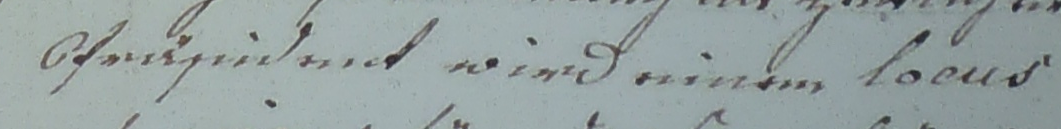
Präsident wird einen locus
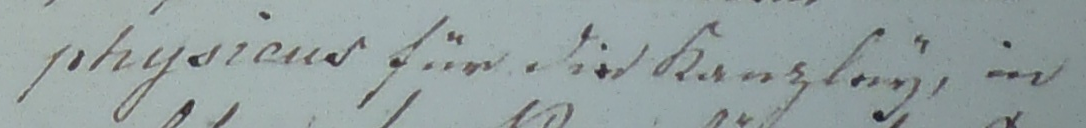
physicus für die Kanzley, in
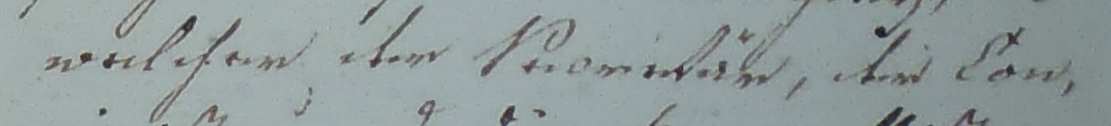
welcher der Secretär, der Con¬
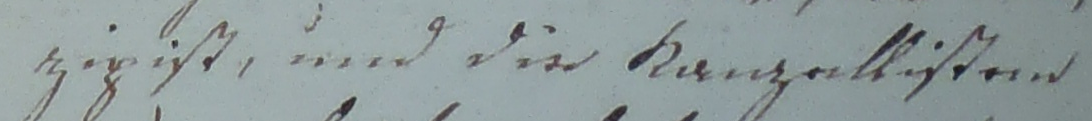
zipist, und die Kanzellisten
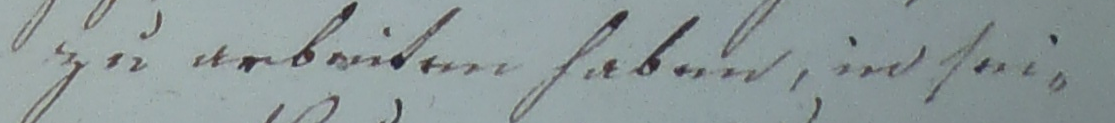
zu arbeiten haben, in sei¬
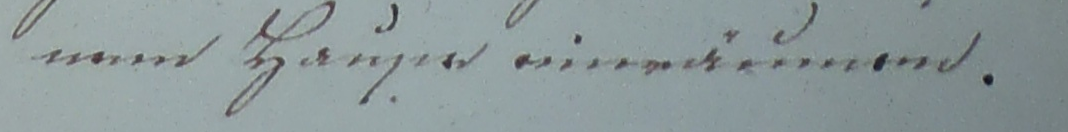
nem Hause einräumen.
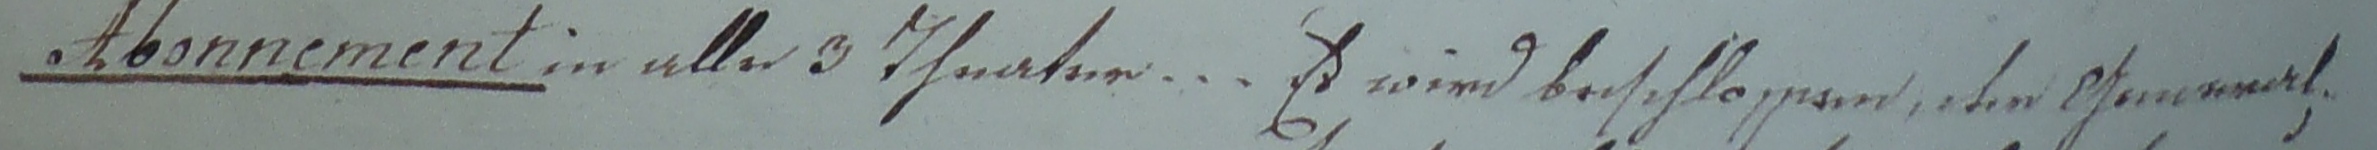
Abonnement in alle 3 Theater … Es wird beschlossen, der General¬
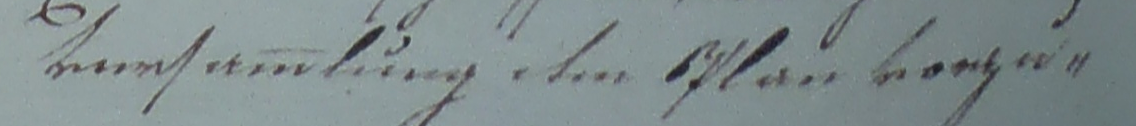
versam̅lung den Plan vorzu¬
